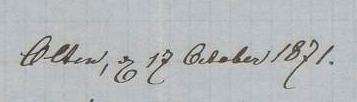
Olten, den 17 October 1871.
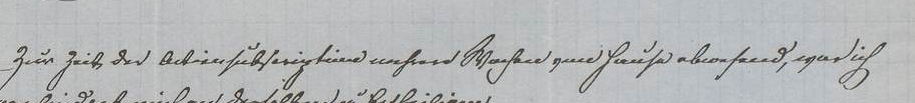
Zur Zeit des Actiensubscription mehrere Wochen von Hause abwesend, war ich
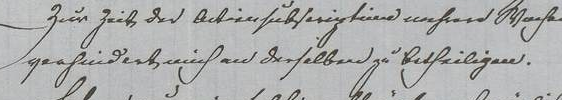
verhindert, mich an derselben zu betheiligen.
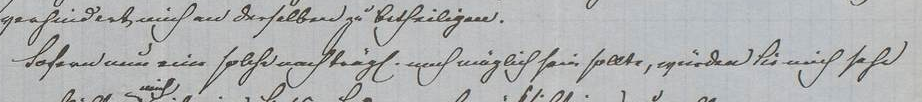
Sofern nun eine solche nachträgl. noch möglich sein sollte, würden Sie mich sehr
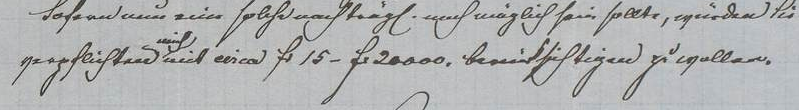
verpflichten auch mit circa fr 15 – fr 20000. berücksichtigen zu wollen.
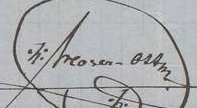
Hochachtend Ihr
